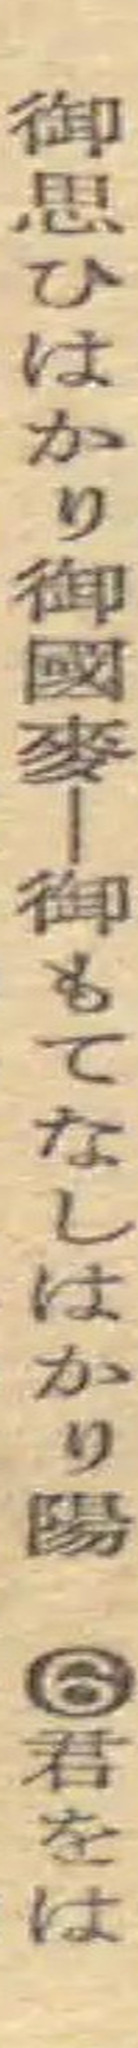御思いはかり御国麦―御もてなしはかり陽❻君をは
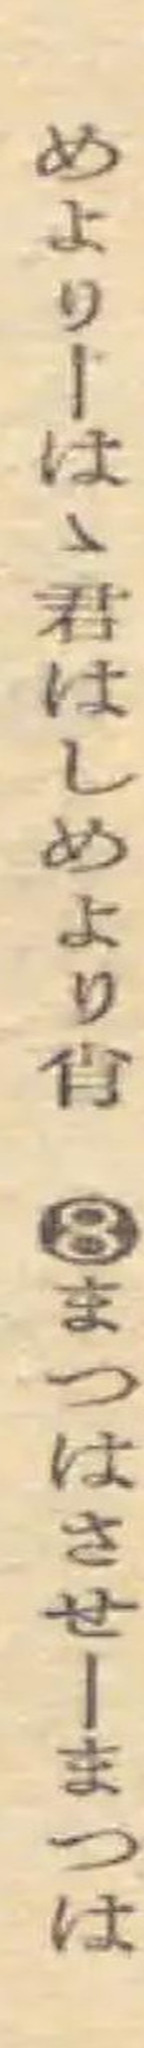めより―はゝ君はしめより肖❽まつはさせ―まつは
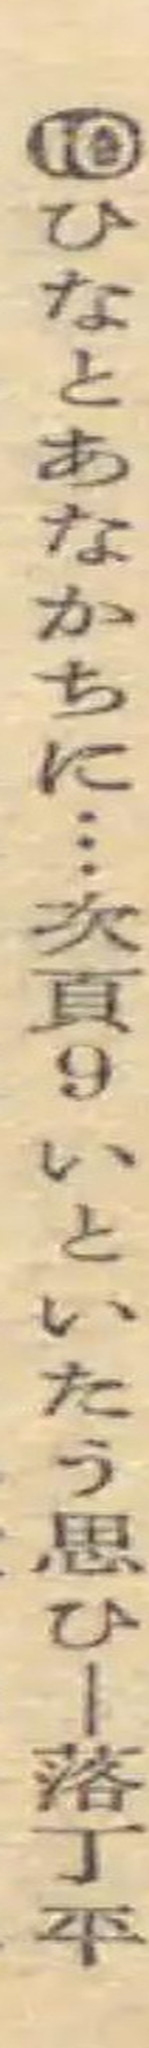❿ひなとあなかちに…次頁９いといたう思ひ―落丁平
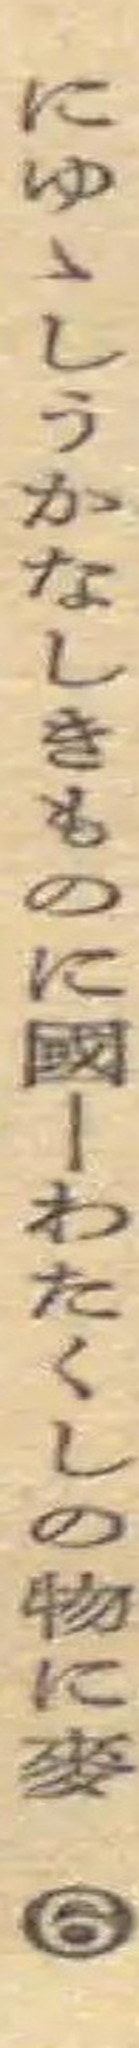にゆゝしうかなしきものに国―わたくしの物に麦❻
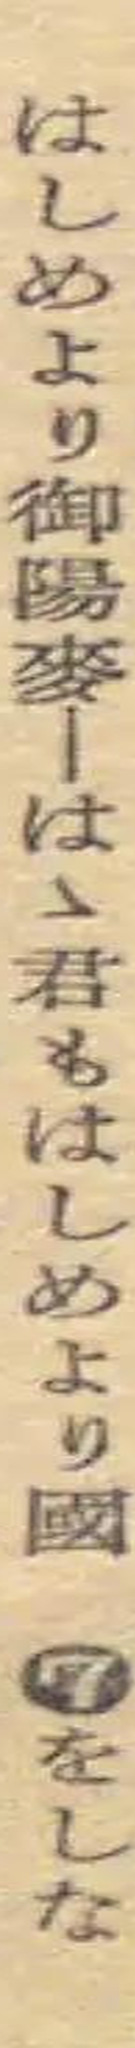はしめより御陽麦―はゝ君もはしめより国❼をしな
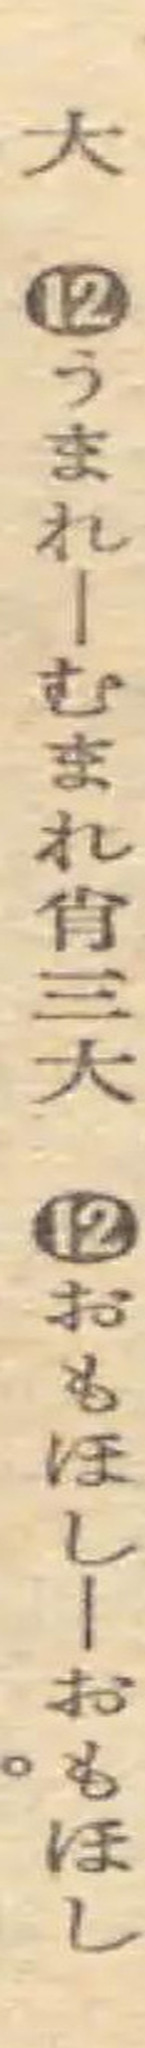大⓬うまれ―むまれ肖三大⓬おもほし―おもほし
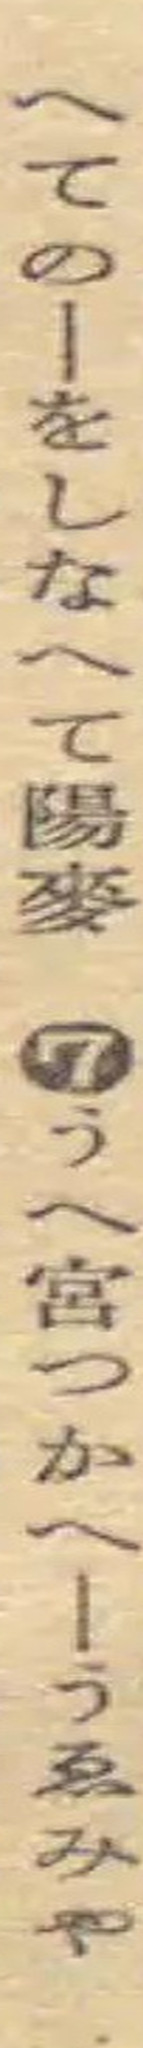へての―をしなへて陽麦❼うへ宮つかへ―うゑみや
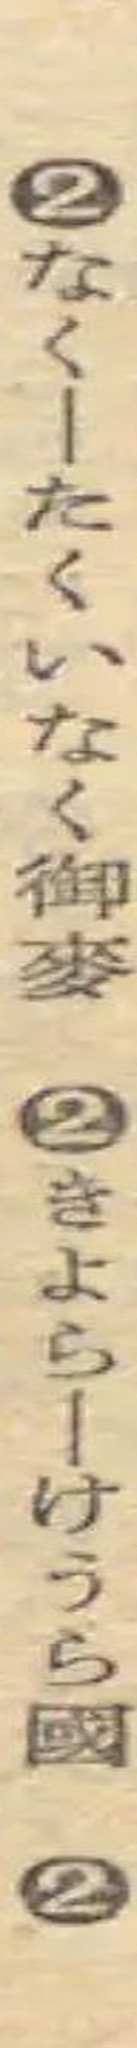➋なく―たくいなく御麦➋きよら―けうら国➋
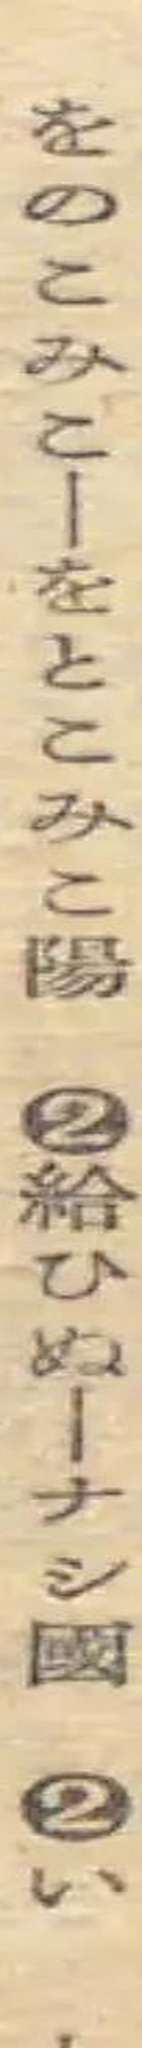をのこみこ―をとこみこ陽➋給ひぬ―ナシ国➋い
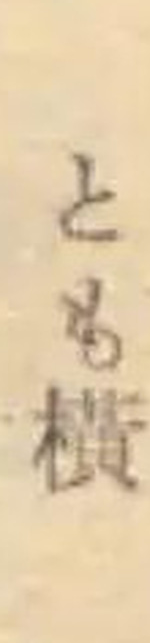とも横
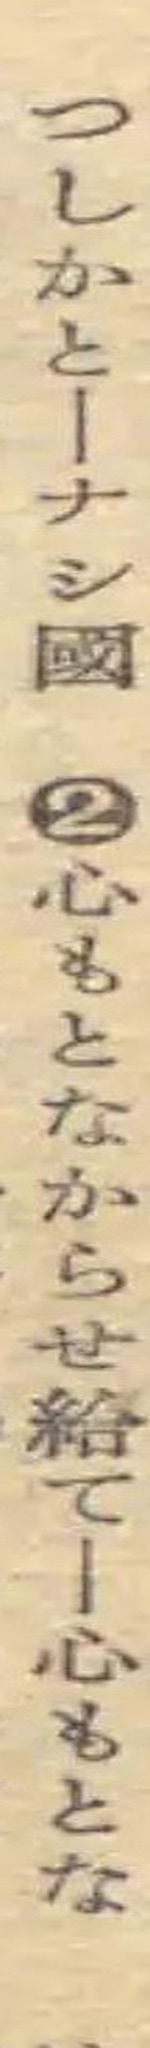つしかと―ナシ国➋心もとなからせ給て―心もとな
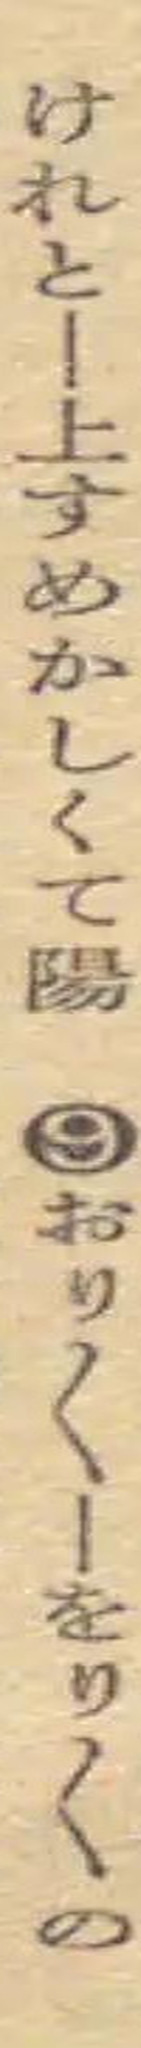けれと―上すめかしくて陽❾おり〳〵―をり〳〵の
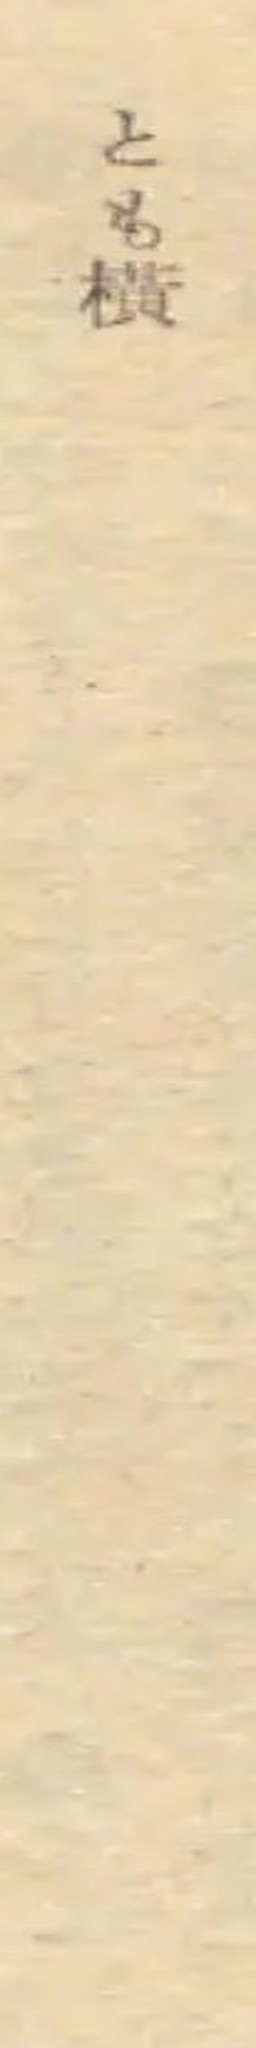とも横
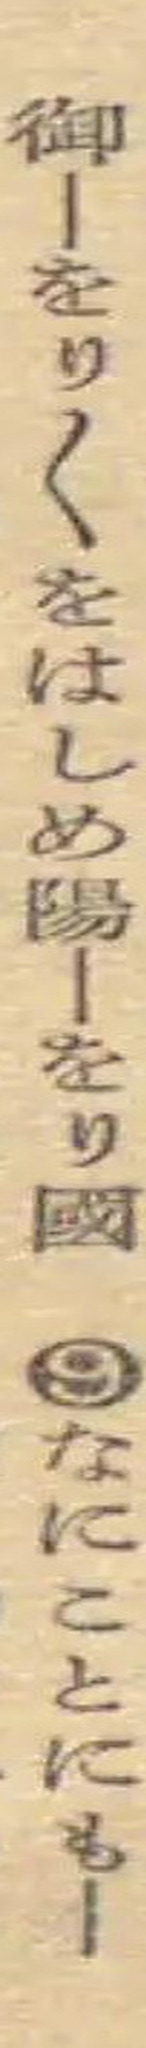御―をり〳〵をはしめ陽―をり国❾なにことにも―
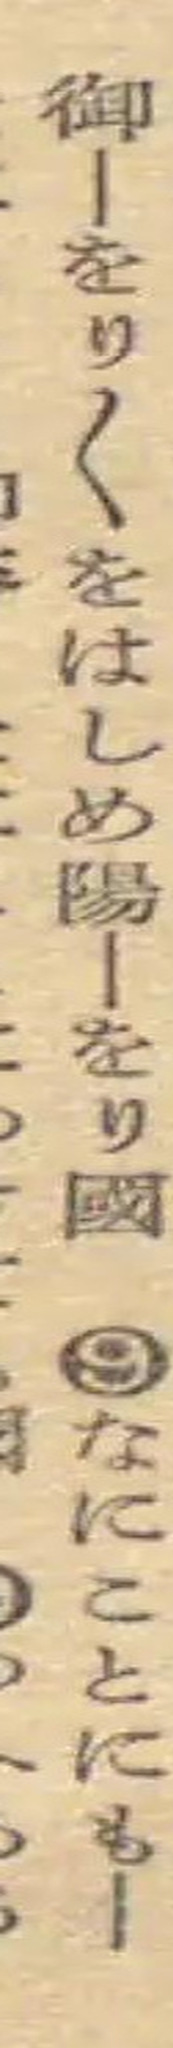御―をり〳〵をはしめ陽―をり国❾なにことにも―
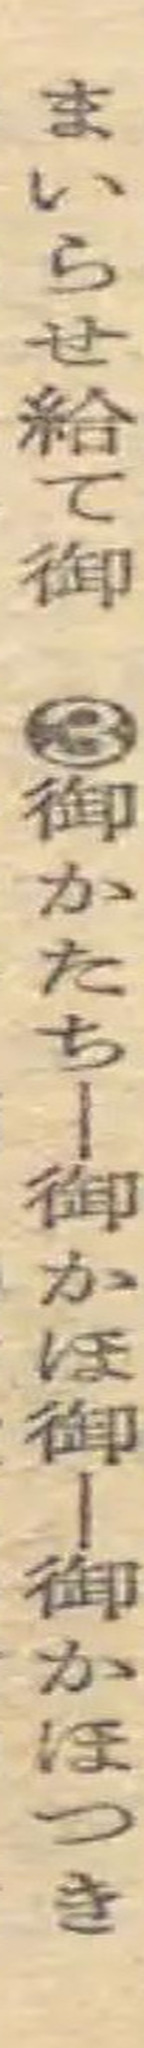まいらせ給て御❸御かたち―御かほ御―御かほつき
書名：校異源氏物語.
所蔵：国立国会図書館 National Diet Library, JAPAN
